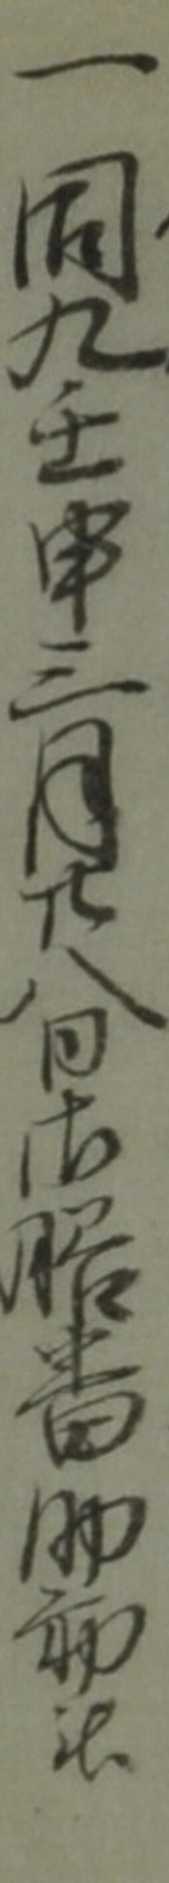一同九壬申三月廿八日御膳番助勤被
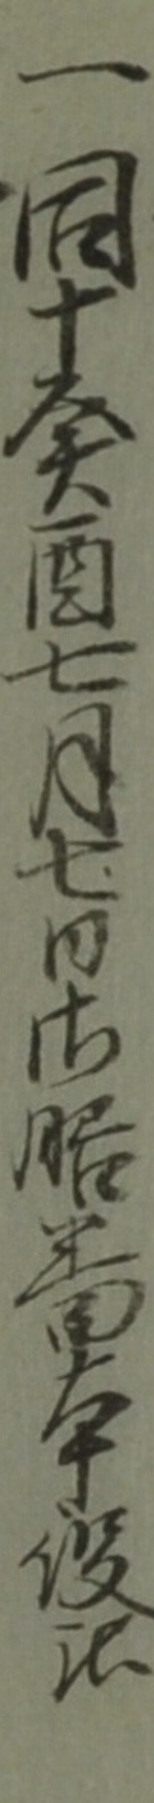一同十癸酉七月七日御膳番本役被
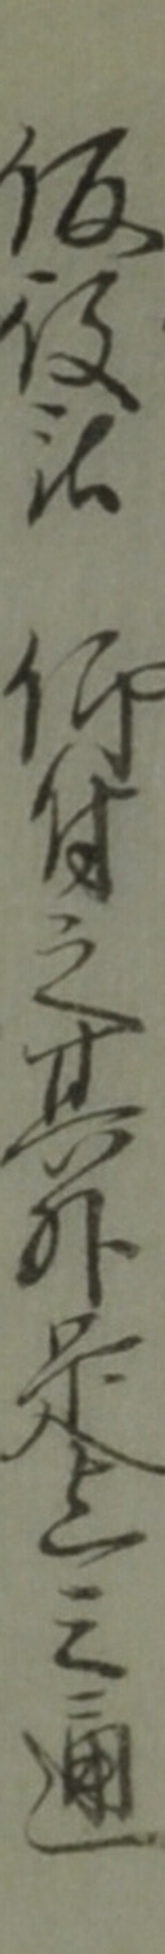仮役被仰付之其外是迄之通
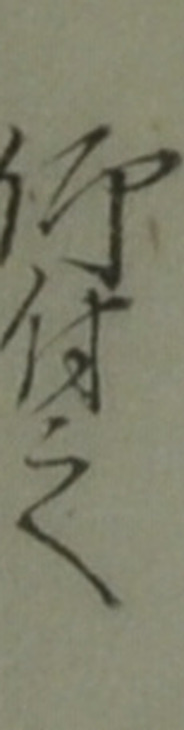仰付之
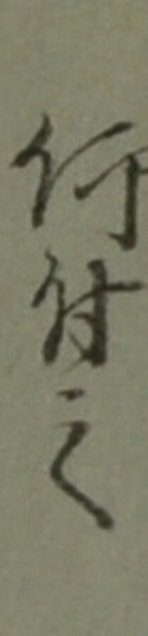仰付之
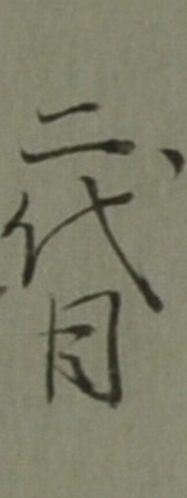二代目
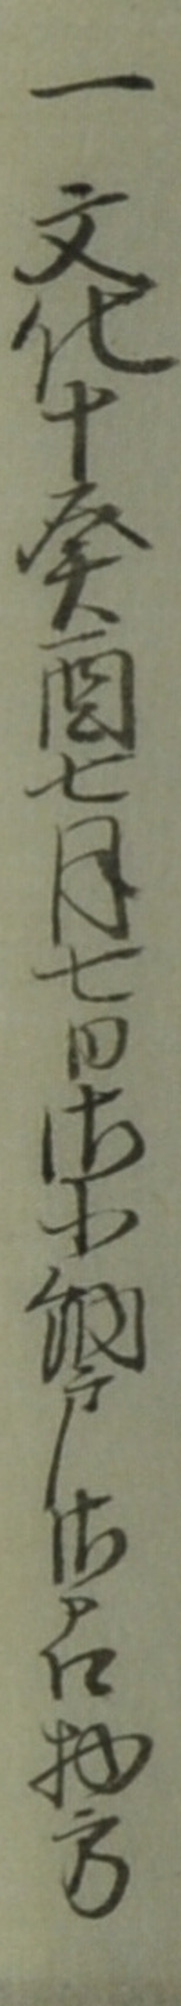一文化十癸酉七月七日御小納戸御召物方
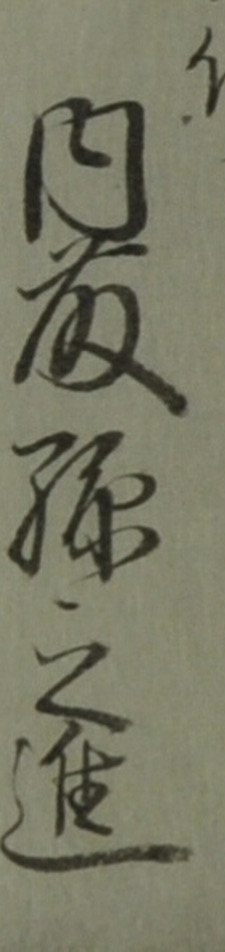内藤孫之進

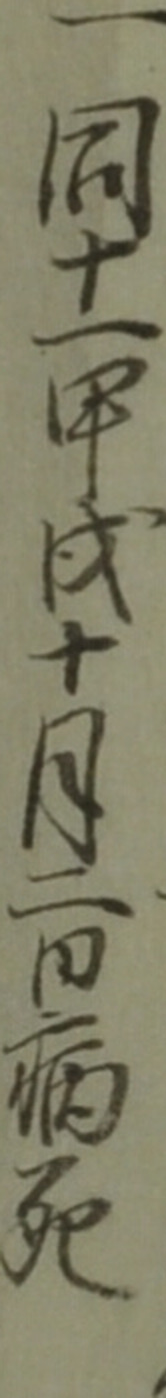一同十一甲戌十月二日病死
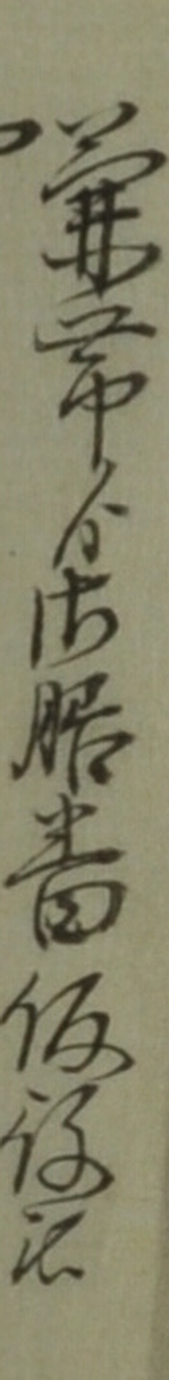兼帯ゟ御膳番仮役被
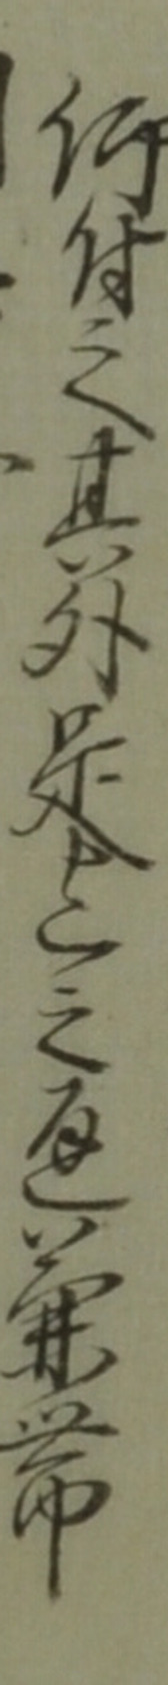仰付之其外是迄之通兼帯
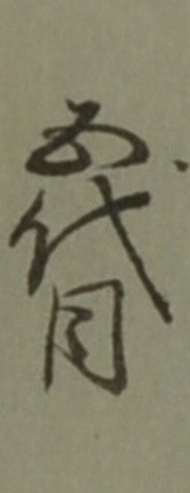五代目
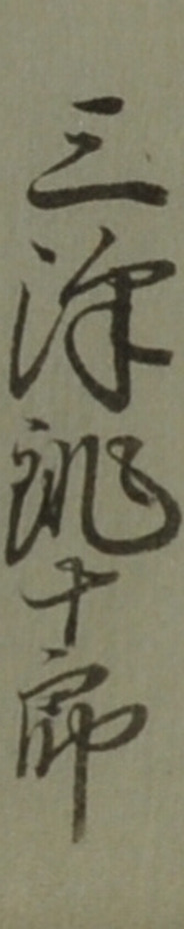三沢銚十郎
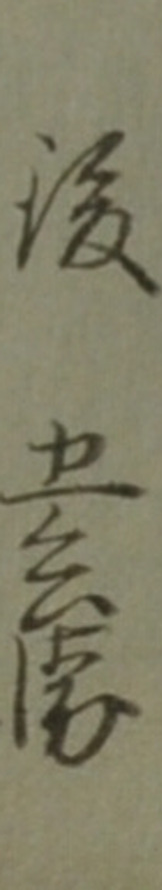後五兵衛
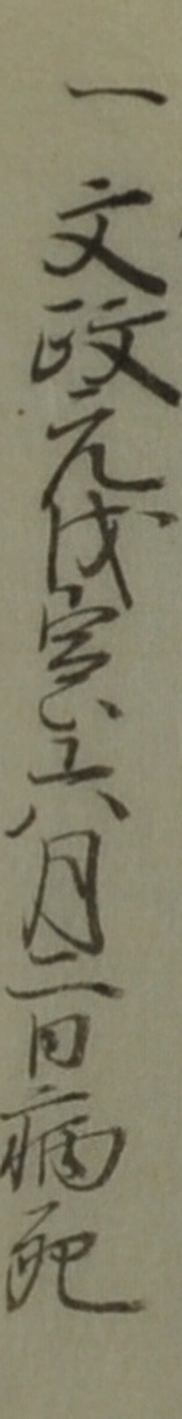一文政元戊寅六月二日病死
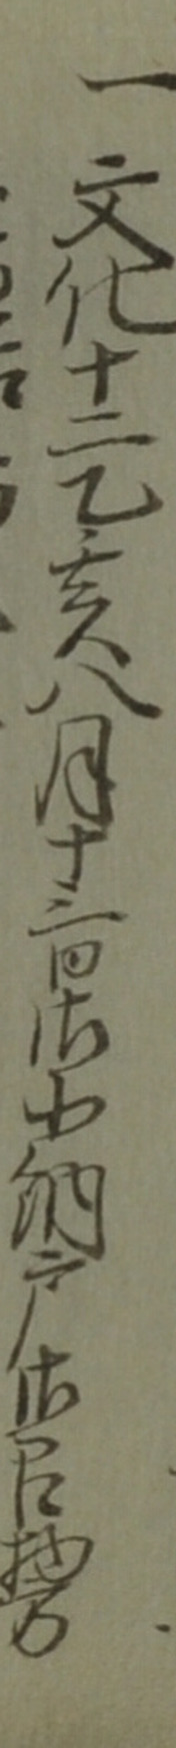一文化十二乙亥八月十三日御小納戸御召物方
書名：諸御役代々録（四）
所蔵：伊那市立高遠町図書館・合同会社AMANE
